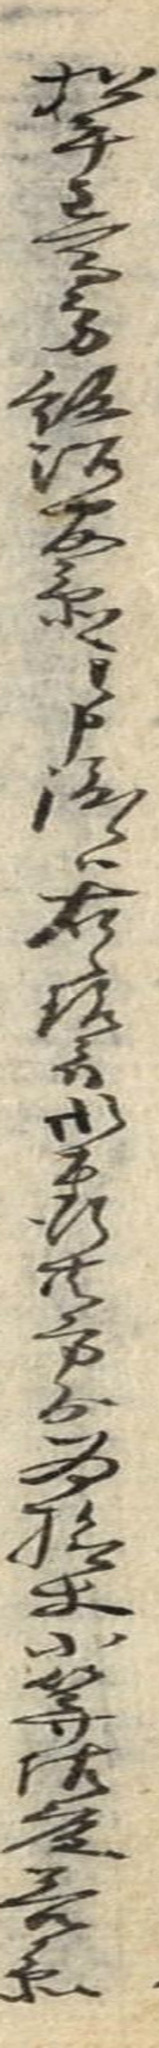松平主馬方飯沼官兵衛へ被申渡候は右之趣に付御奉行共方ゟ為検使小算佐藤善兵衛
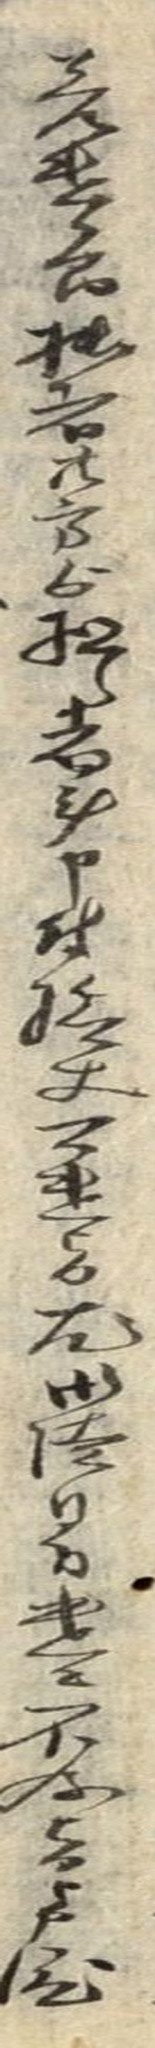差遣候間拙者共方ゟ組之者斗申付検使可遣旨尤御徒目付遣に不及旨被申渡
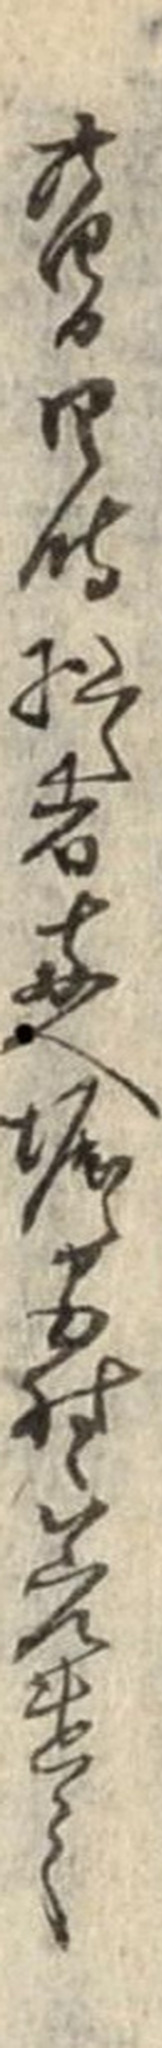廿四日四時組之者両人堀之宮村へ差遣之
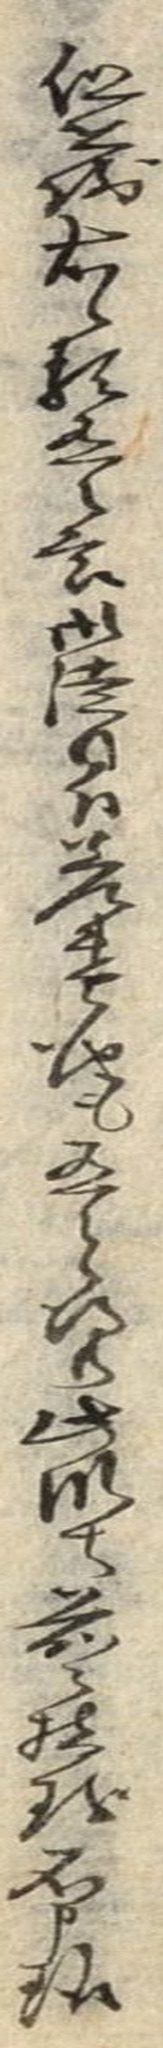但近例右之類有之節御徒目付差遣候儀も有之候得共此段は前々指越不申趣
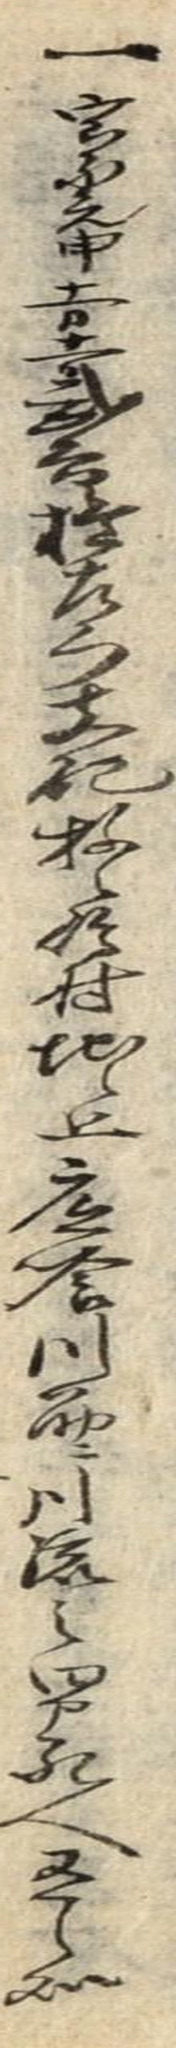一宝永元申十一月十一日武曽権左衛門支配牧之島村地之上底喰川筋に川流之男死人有之処
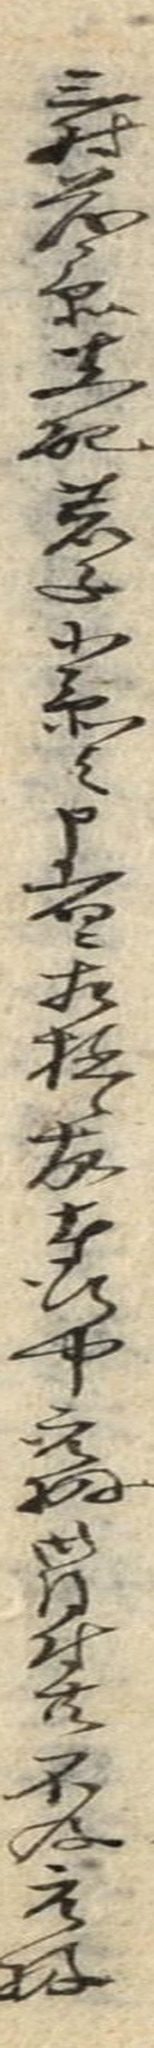三村茂兵衛支配荒子小兵衛と申者に相極候故奉行中取扱御目付共不及取扱
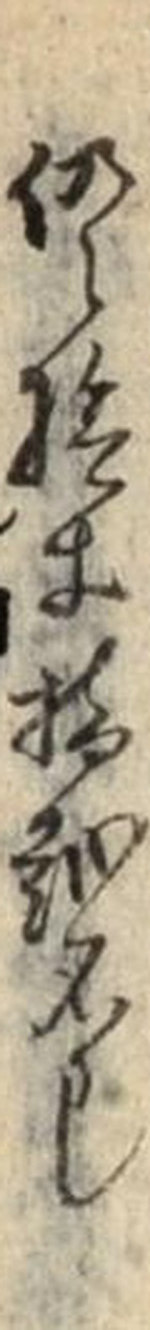仍之検使指越不申候

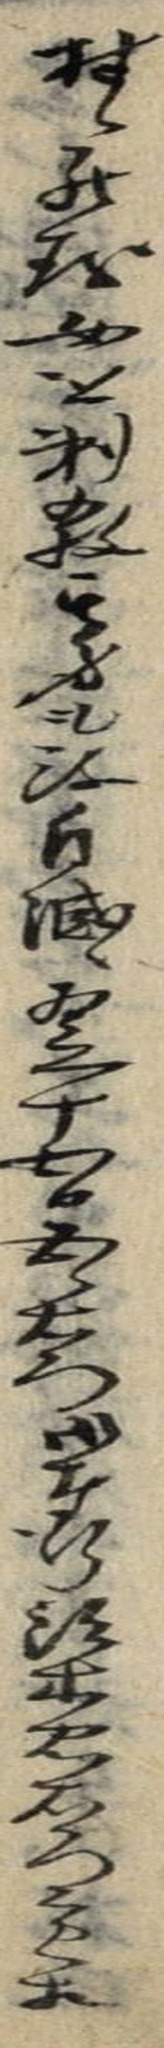村へ罷越女を刺殺其身も致自滅候翌十五日五郎右衛門御奉行鈴木忠右衛門方へ相
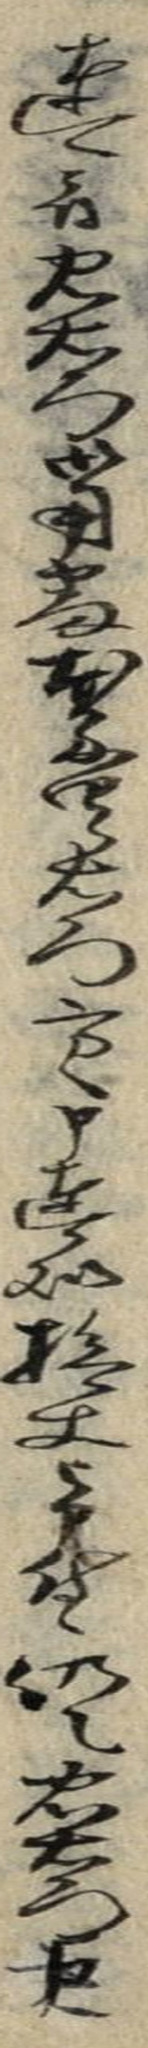達候に付忠右衛門御用番本多四郎右衛門方へ申達候処検使被申付候仍之忠右衛門申
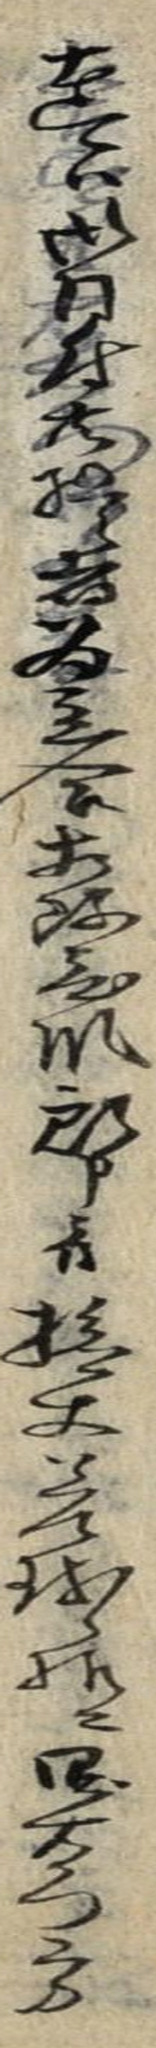達候は御目付共組之者為立合相改度段願申に付検使差越候様に四郎右衛門方
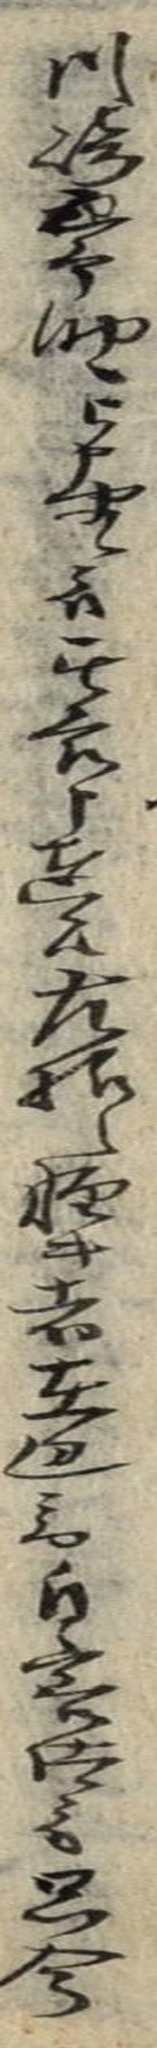川崎三郎助へ被申聞候に付其節申達候は左様之軽キ者在辺にて自害仕候に付只今
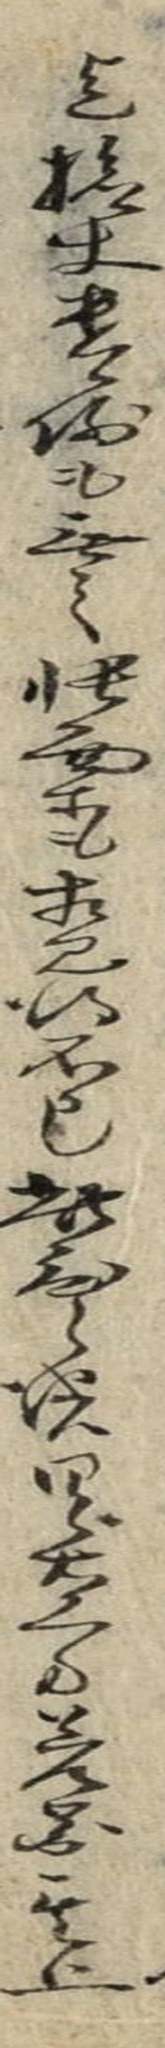迄検使遣候儀も無之帳面等も相見得不申候此度之儀は四郎右衛門方差図其上
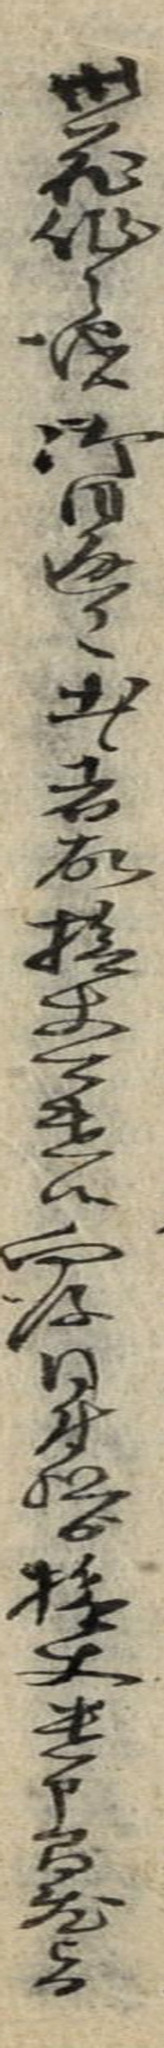御花作之儀は御目通りへ出候者故検使可遣候向後目付組ゟ検使遣申間敷旨
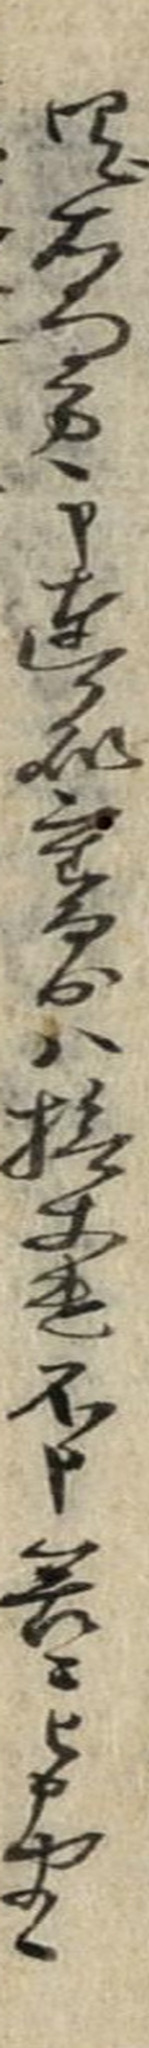四郎右衛門方へ申達候処重てゟは検使遣不申筈と被申聞候
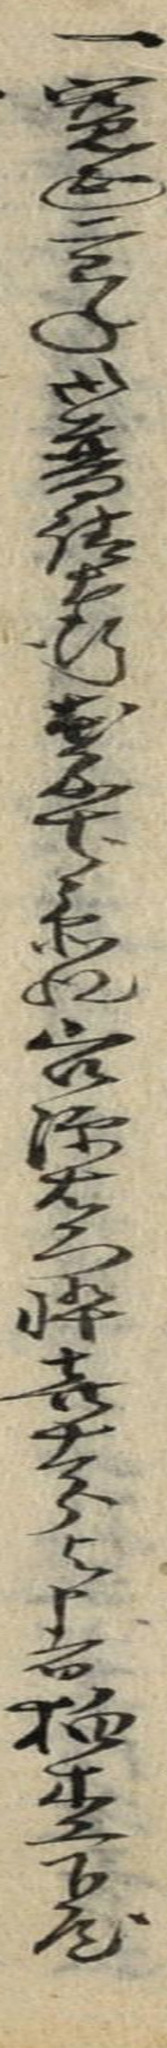一寛延二巳年御普請奉行本多十郎兵衛組山口源右衛門悴喜太郎と申者狛木工下屋
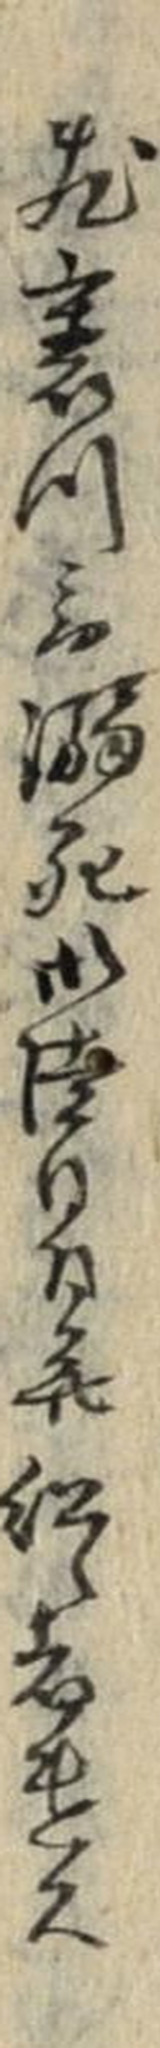敷裏川にて溺死御徒目付并組之者遣ス
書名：御停止異変死失
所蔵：福井県文書館 Fukui Prefectural Archives
